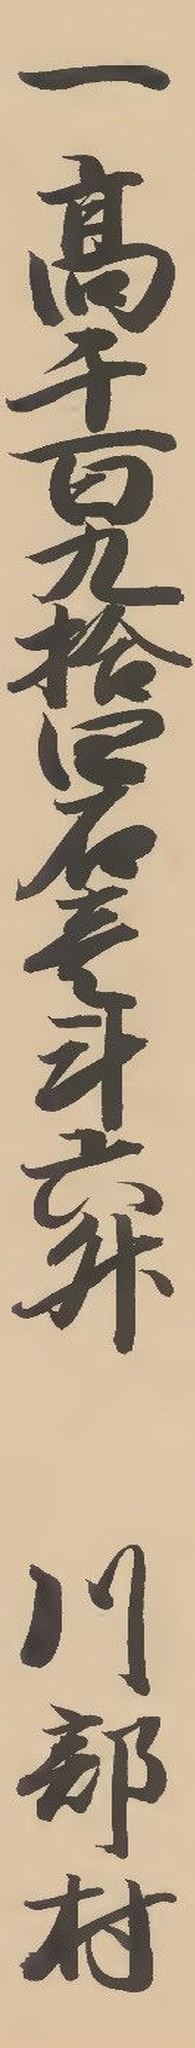一高千百九拾四石壱斗六升川部村
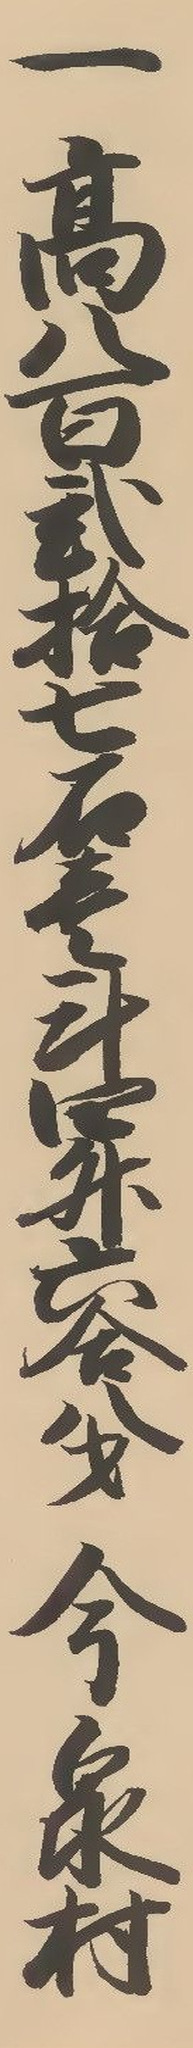一高八百弐拾七石壱斗四升六合八才今泉村
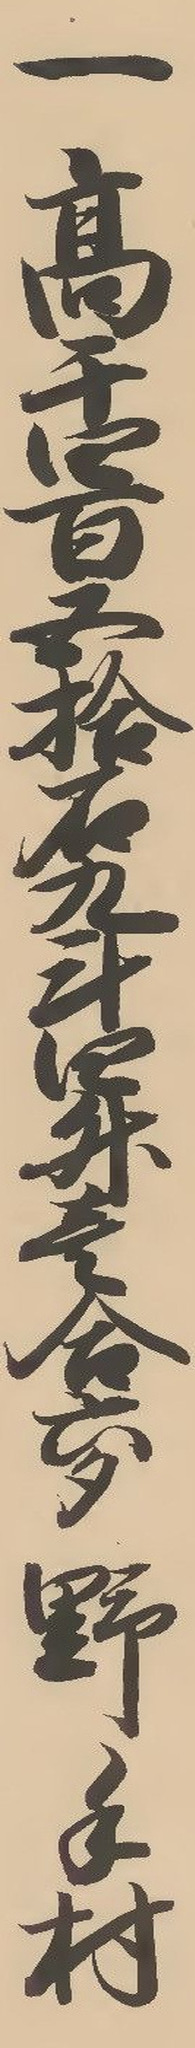一高千四百五拾石九斗四升壱合六勺野手村

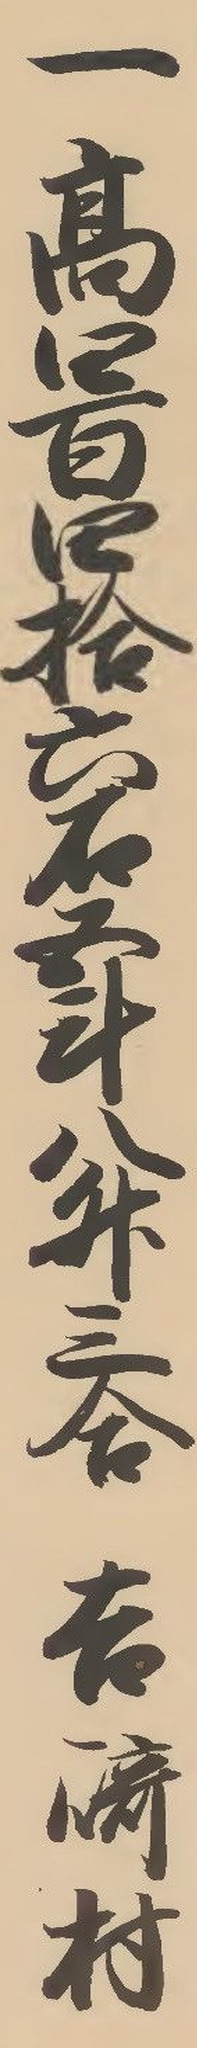一高四百四拾六石五斗八升三合吉崎村
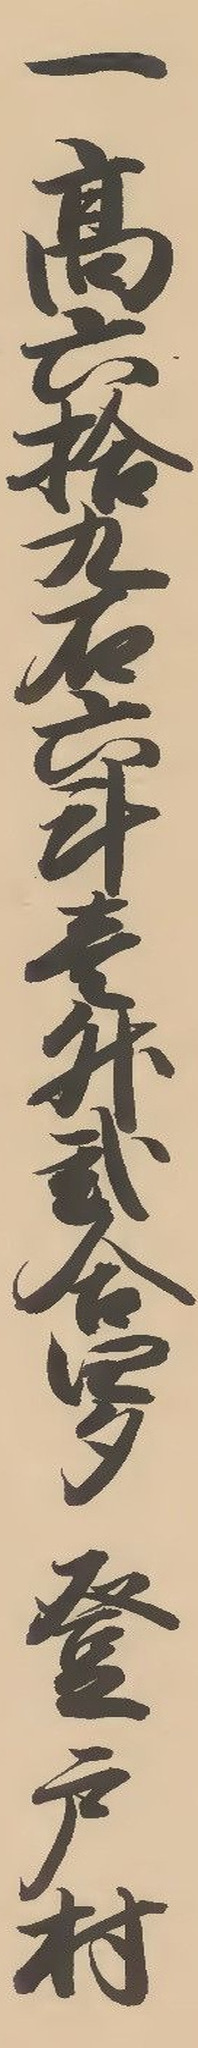一高六拾九石六斗壱升弐合四勺登戸村
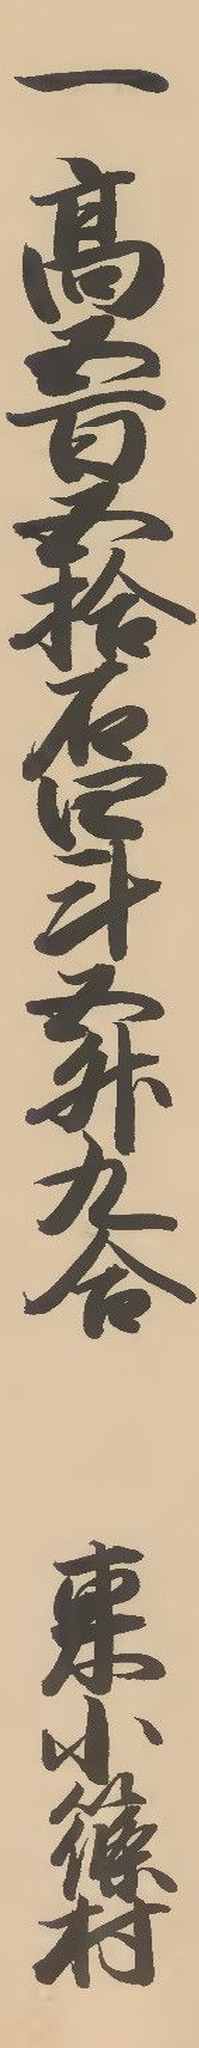一高五百五拾石四斗五升九合東小篠村
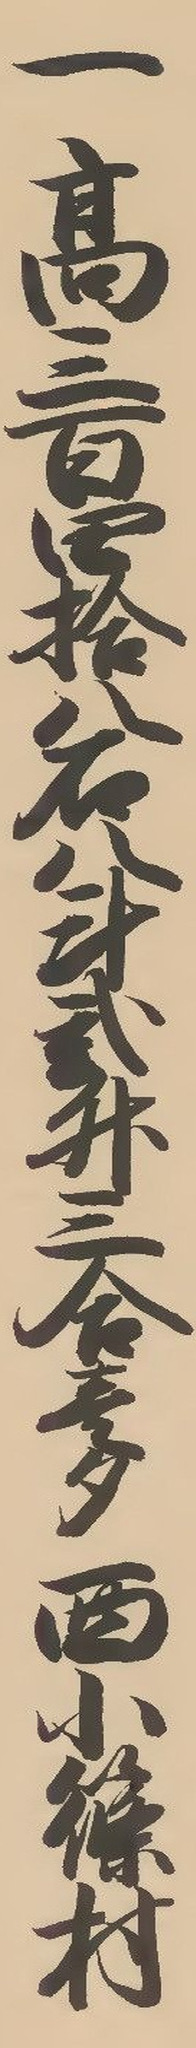一高三百四拾八石八斗弐升三合壱勺西小篠村
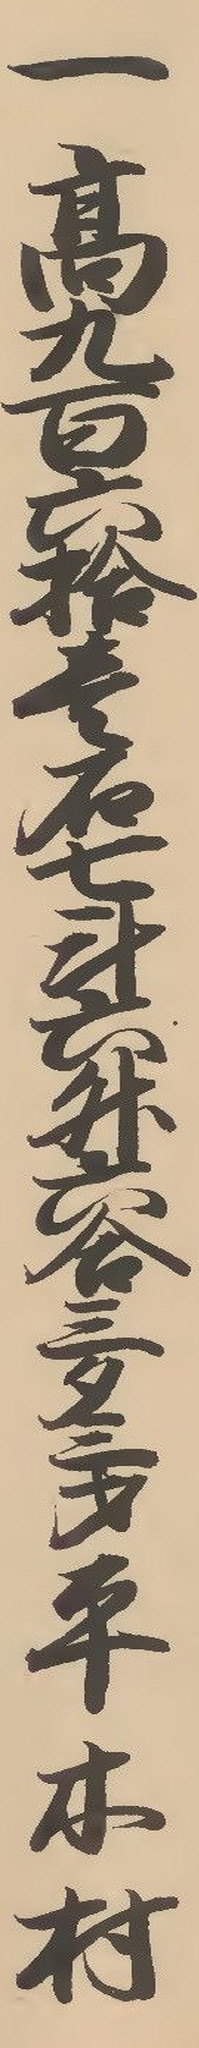一高九百六拾壱石七斗六升六合三勺三才平木村
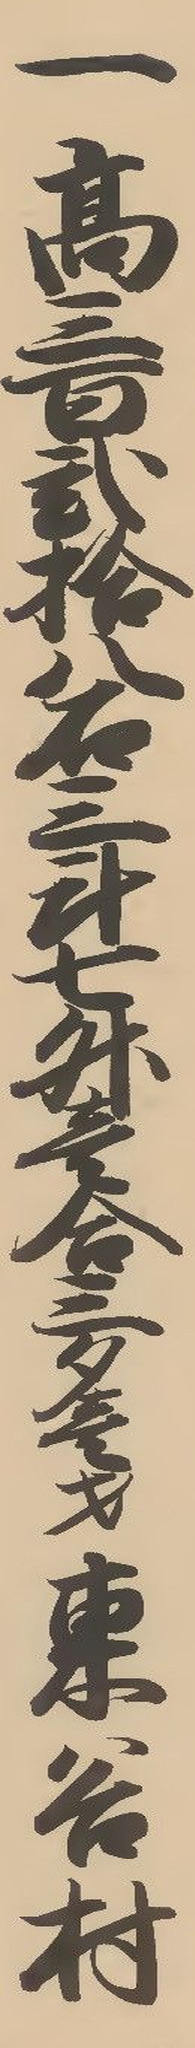一高三百弐拾八石三斗七升壱合三勺壱才東谷村
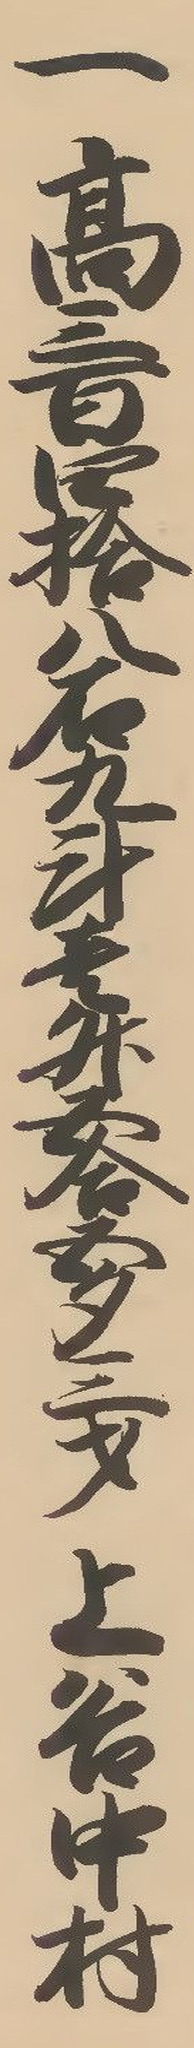一高三百四拾八石九斗壱升五合五勺三才上谷中村

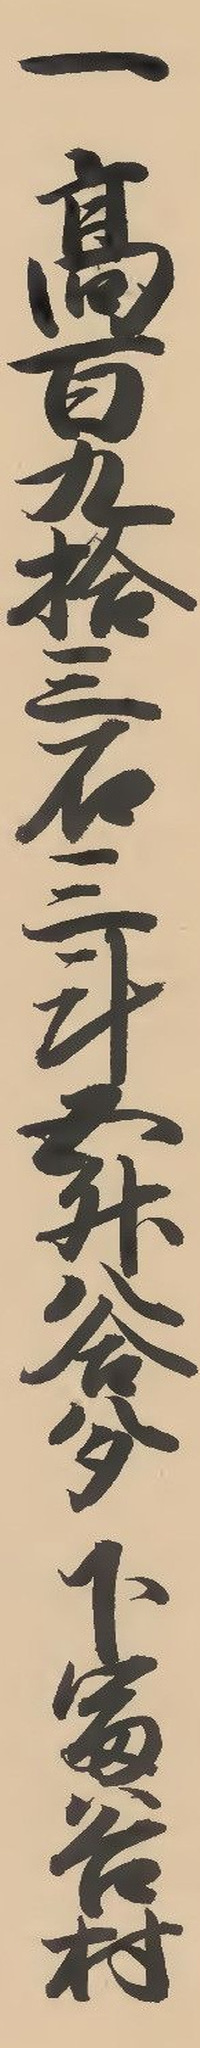一高百九拾三石三斗五升八合八勺下富谷村
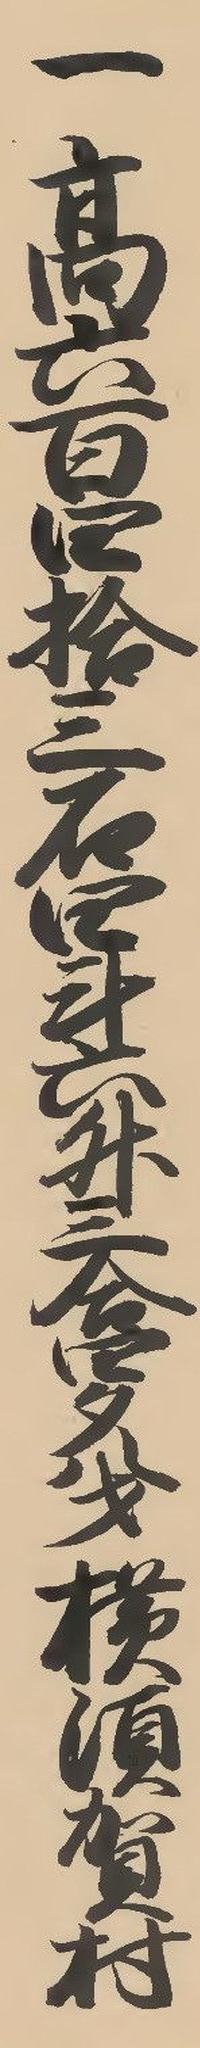一高六百四拾三石四斗六升三合四勺八才横須賀村
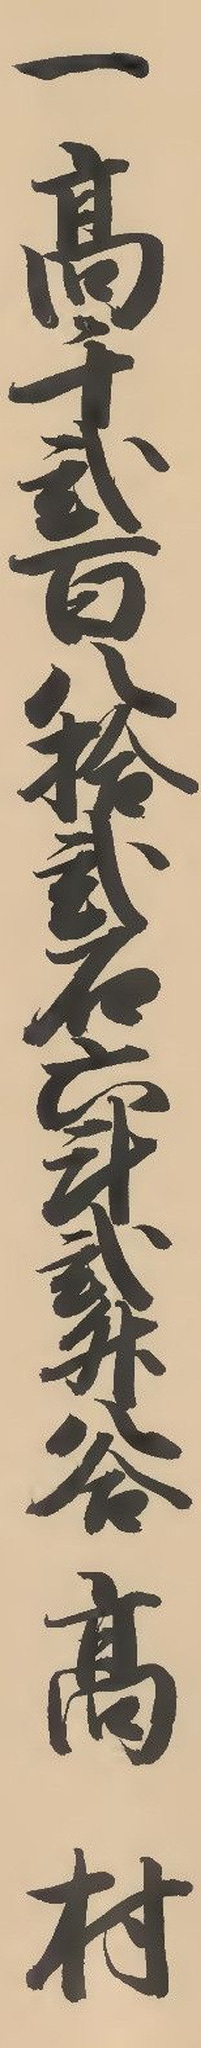一高千弐百八拾弐石六斗弐升八合高村
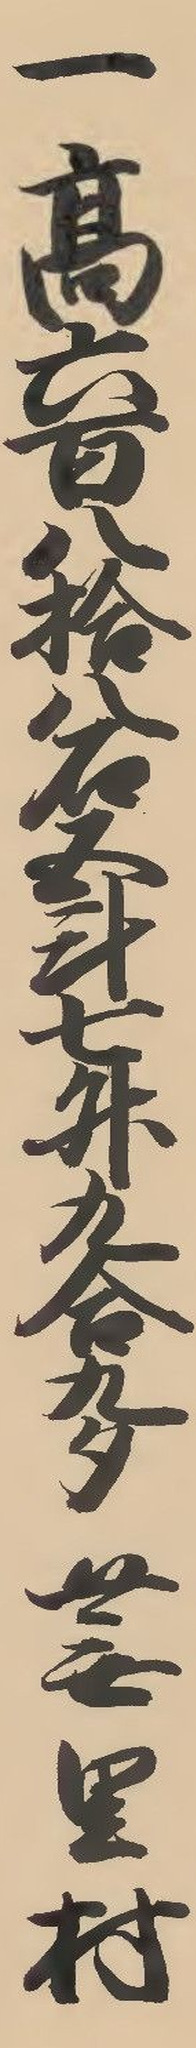一高六百八拾八石五斗七升九合九勺蕪里村
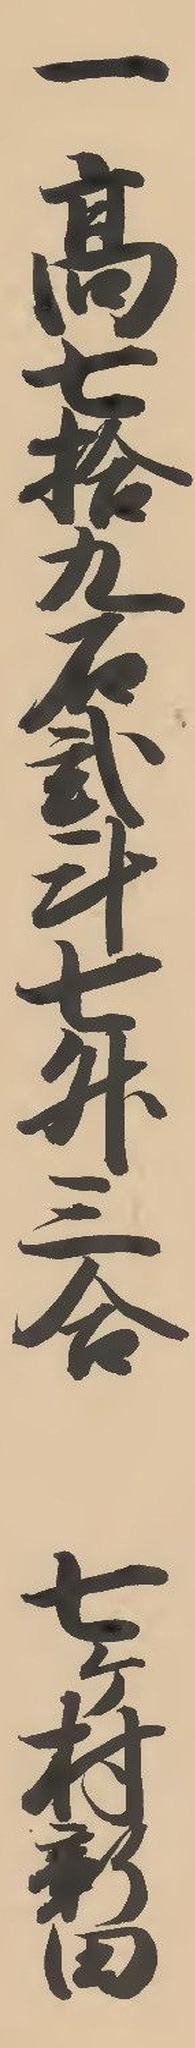一高七拾九石弐斗七升三合七ヶ村新田
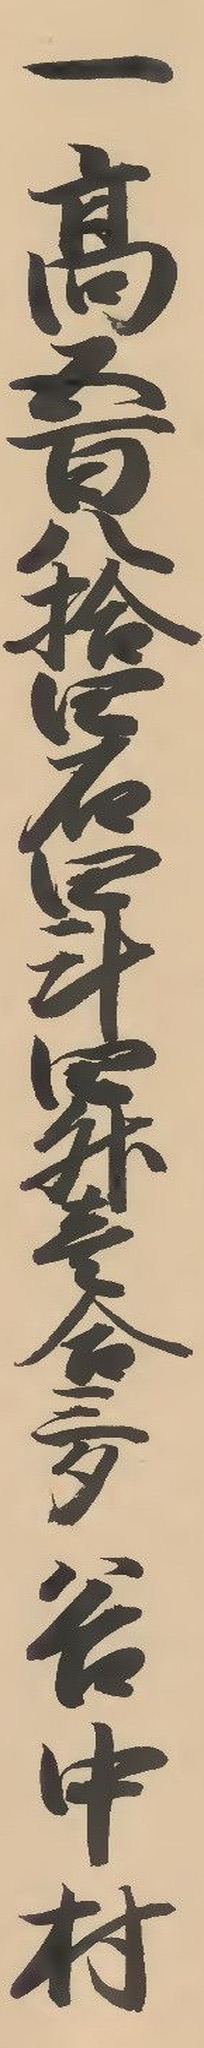一高五百八拾四石四斗四升壱合三勺谷中村
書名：下総国郷帳
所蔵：国立公文書館 National Archives of Japan
